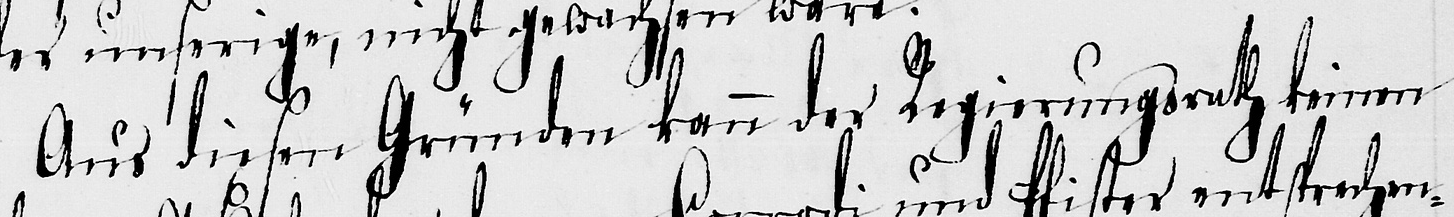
Aus diesen Gründen kann der Regierungsrath keinen
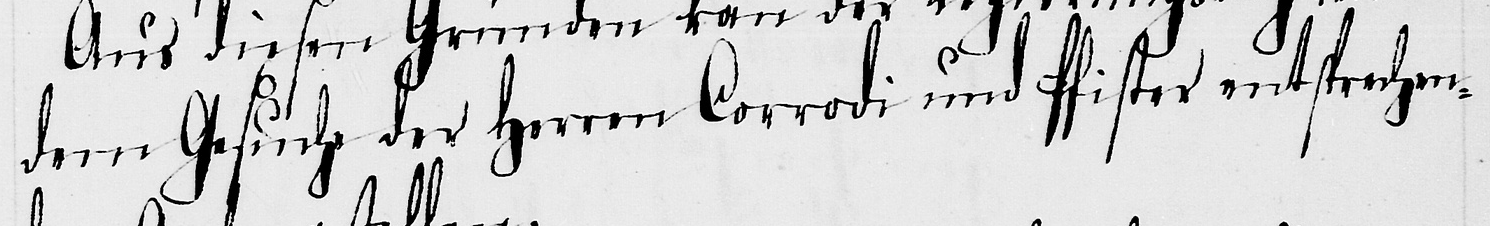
dem Gesuche der Herren Corrodi und Pfister entsprechen¬
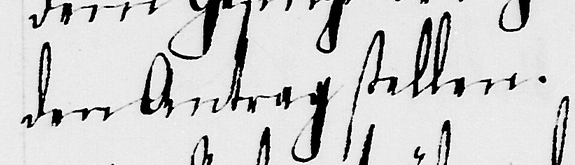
den Antrag stellen.
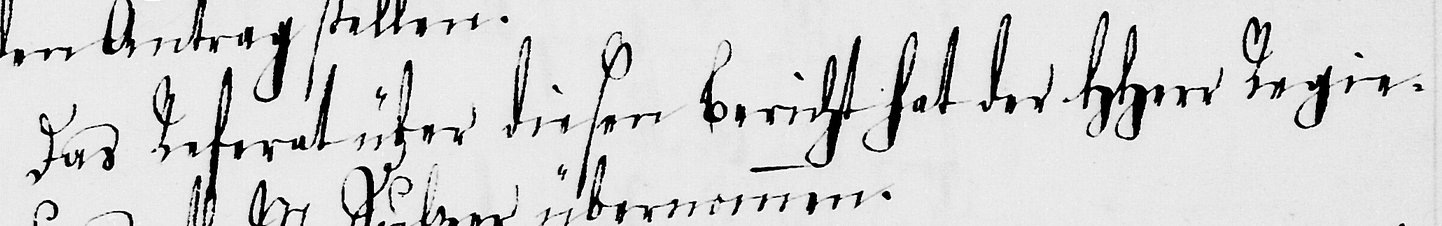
Das Referat über diesen Bericht hat der HHerr Regi¬
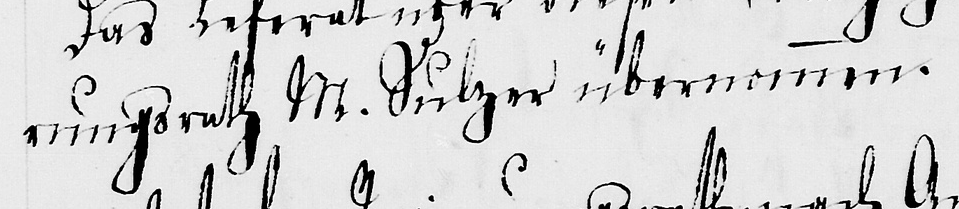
erungsrath M. Sulzer übernommen.
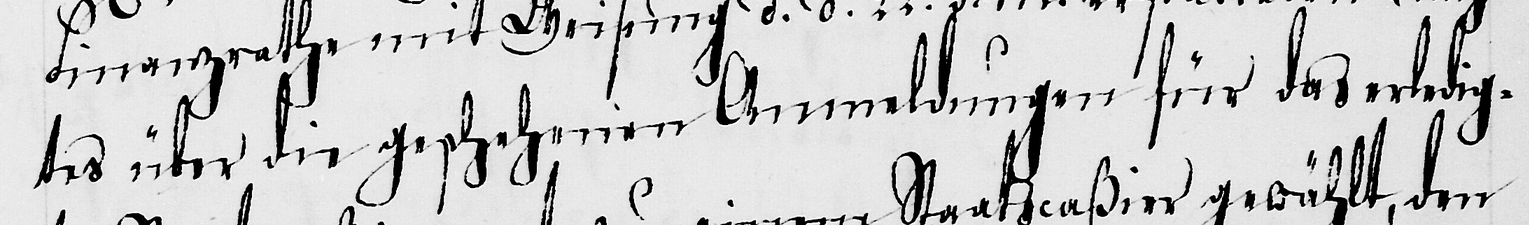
tes über die geschehenen Anmeldungen für das erledig¬
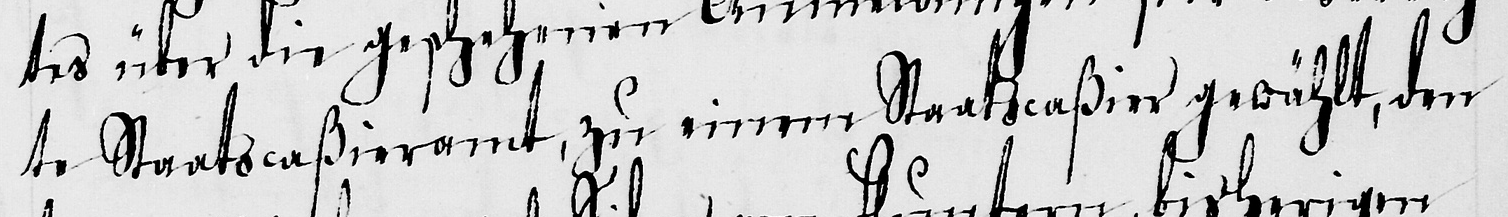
te Staatscaßieramt, zu einem Staatscaßier gewählt, den
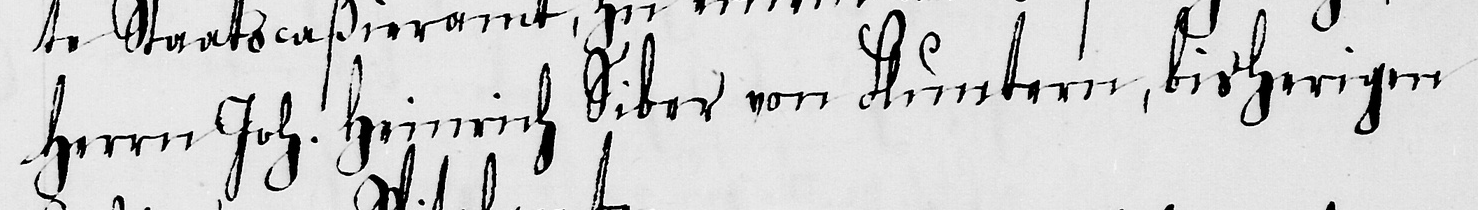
Herrn Joh. Heinrich Siber von Fluntern, bisherigen
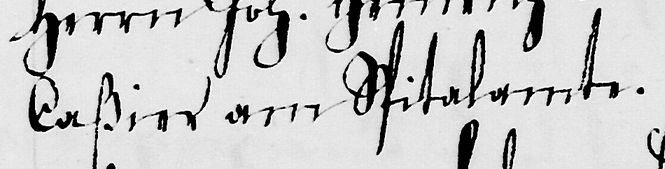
Caßier am Spitalamte.
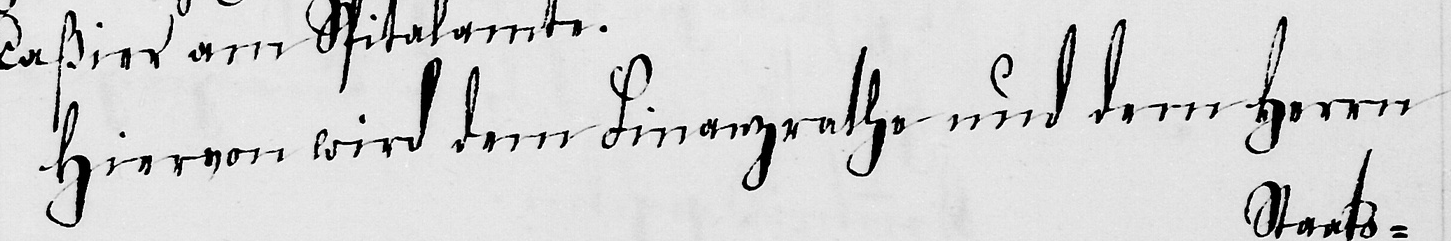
Hiervon wird dem Finanzrathe und dem Herrn
